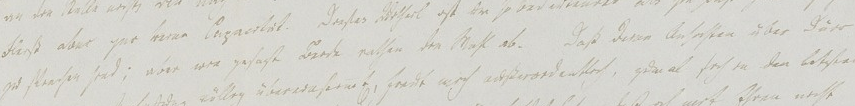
zu sprechen sind; aber wie gesagt Beide rathen die Wahl ab. Daß Deine Ansichten über Dürr
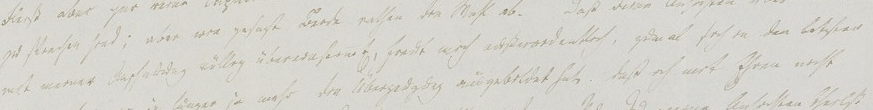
mit meiner Anschauung völlig übereinstimmten, freut mich außerordentlich, zumal sich in den letzten
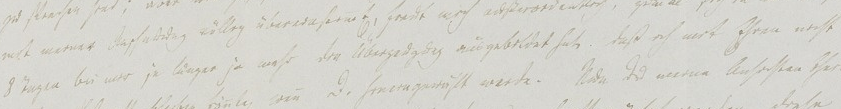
8 Tagen bei mir je länger je mehr die Überzeugung ausgebildet hat, daß ich mit Ehren nicht
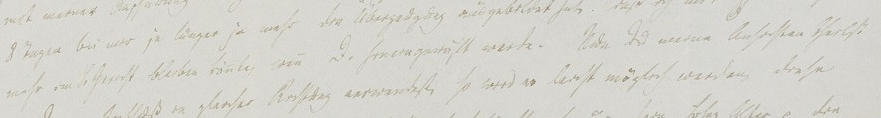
mehr im B.Gericht bleiben könnte, wenn D. hineingewählt werde. Nun Du meine Ansichten theilst
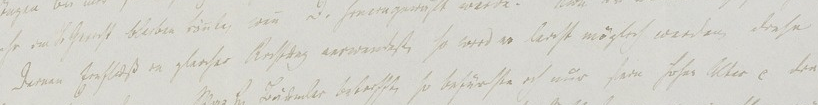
Deinen Einfluß in gleicher Richtung verwendest, so wird es leicht möglich werden, diese
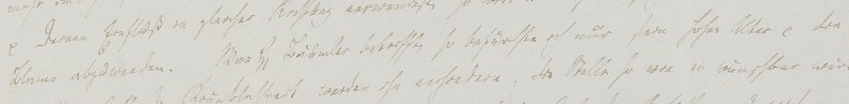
Blame abzuwenden. Was Herrn Bäumler betrifft, so befürchte ich nur sein hohes Alter & die
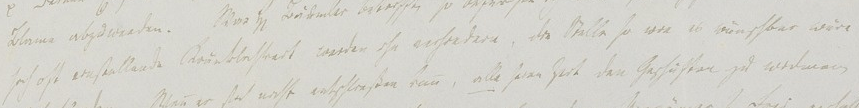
sich oft einstellende Kränklichkeit werden ihn verhindern, die Stelle so wie es wünschbar wäre
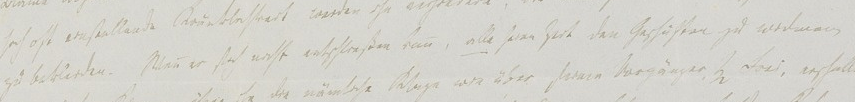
zu bekleiden. Wenn er sich nicht entschließen kann, alle seine Zeit den Geschäften zu widmen,
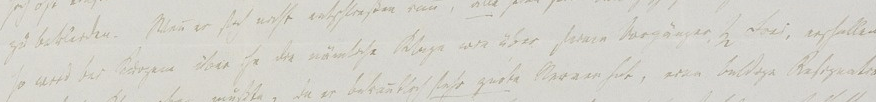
so wird bei Kurzem über ihn die nämliche Klage wie über seinen Vorgänger, Herrn Frei, erschallen,
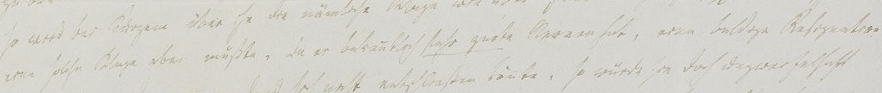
eine solche Klage aber müßte, da er bekanntlich sehr zarte Nerven hat, eine baldige Resignation
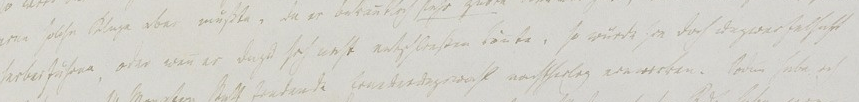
herbeiführen, oder wenn er dazu sich nicht entschließen könnte, so würde sie doch unzweifelhaft
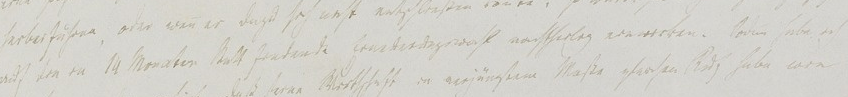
auf die in 14 Monaten Statt findende Erneuerungswahl nachtheilig einwirken. Sodann habe ich
